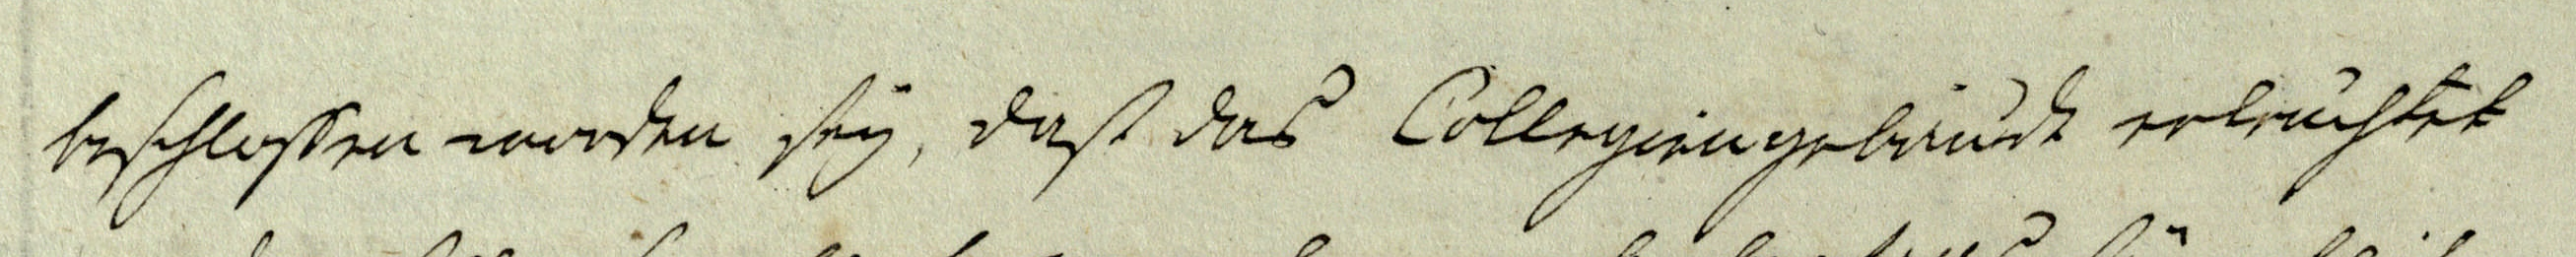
beschlossen worden seÿ, daß das Collegiengebäude erleuchtet
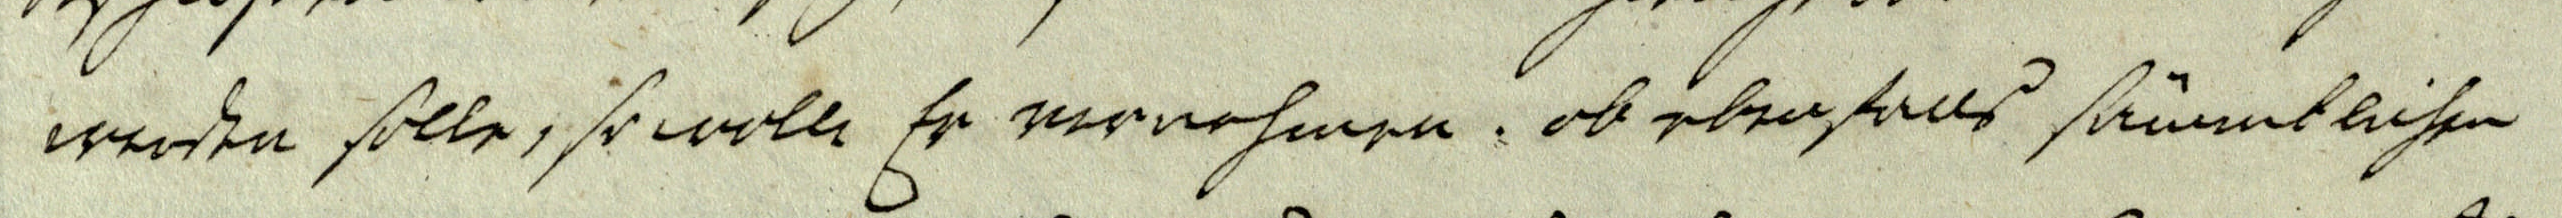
werden solle, so wolle Er vernehmen, ob ebenfalls sämmtlichen
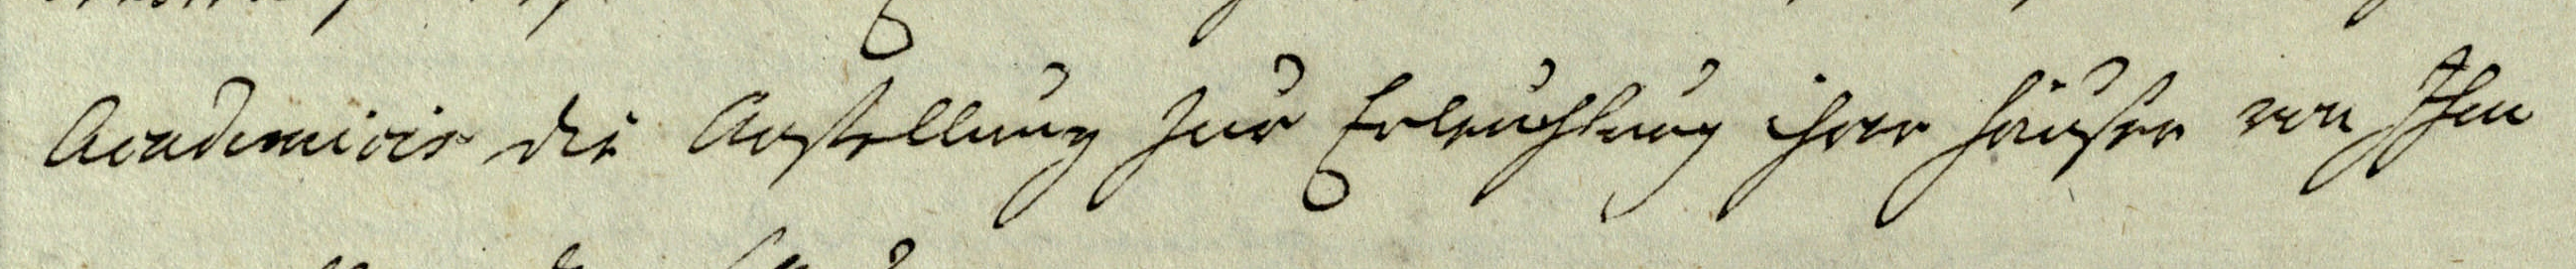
Academicis die Anstellung zur Erleuchtung ihrer Häuser von Ihm
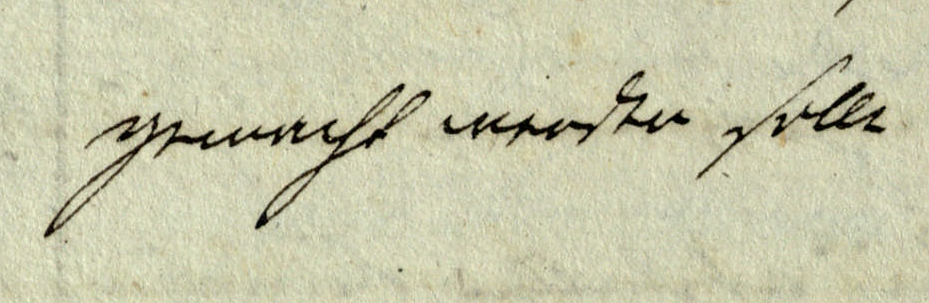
gemacht werden solle?
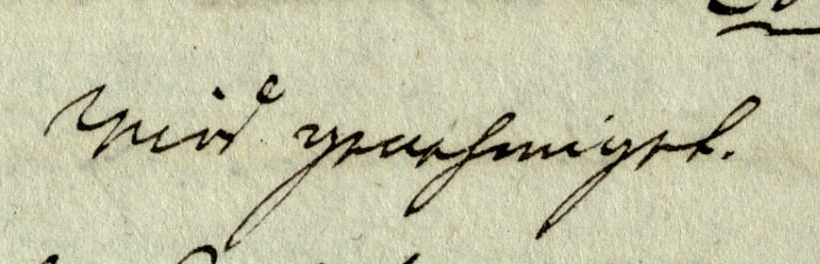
Wird genehmiget.
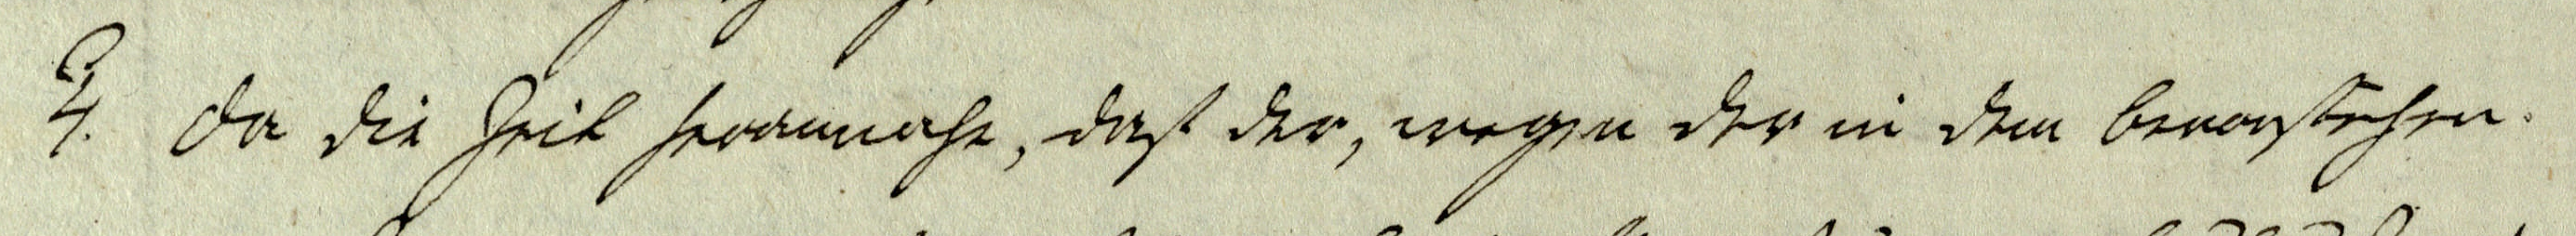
4. Da die Zeit herannahe, daß der, wegen der in dem bevorstehen¬
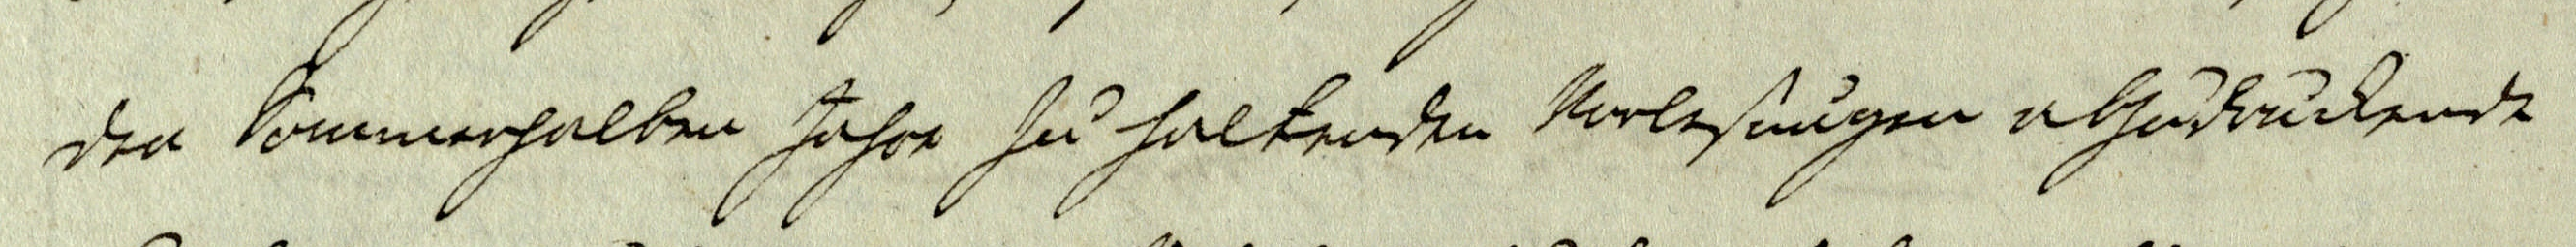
den Sommerhalben Jahre zu haltenden Vorlesungen abzudruckende
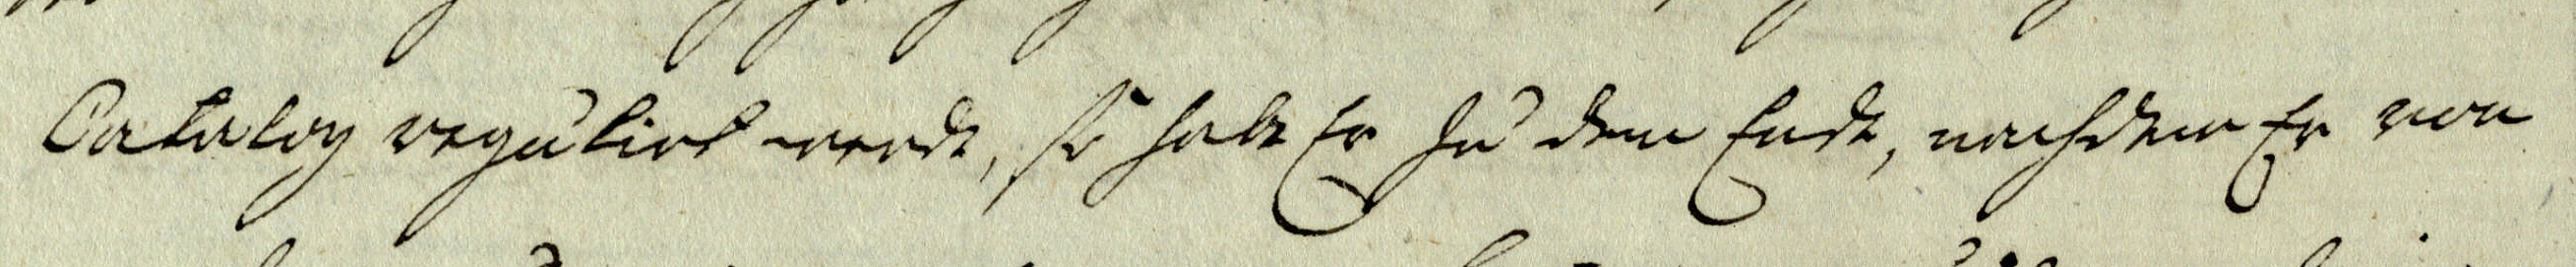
Catalog reputirt werde, so habe Er zu dem Ende, nachdem Er von
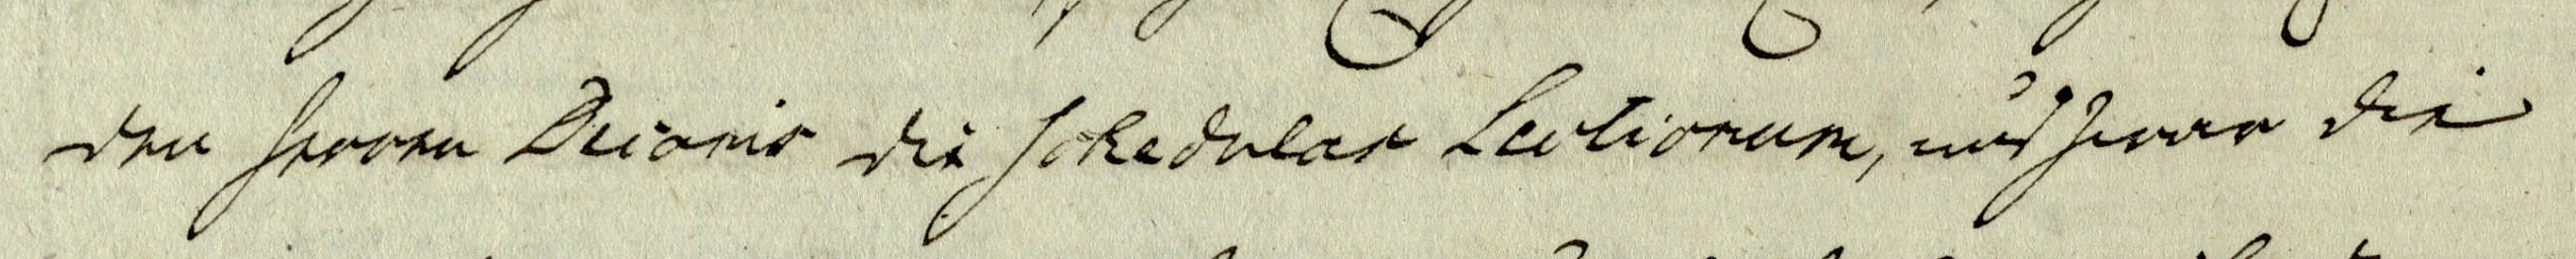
den Herren Decanis die Schedular Lectionum, und zwar die
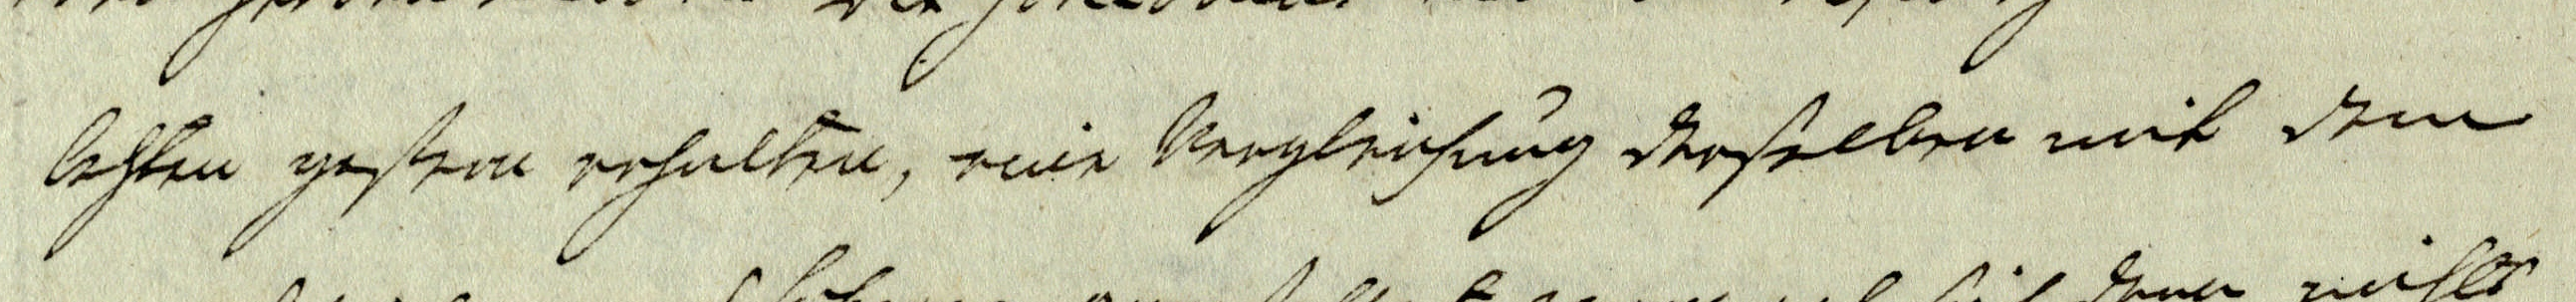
letzten gestern erhalten, eine Vergleichung derselben mit dem
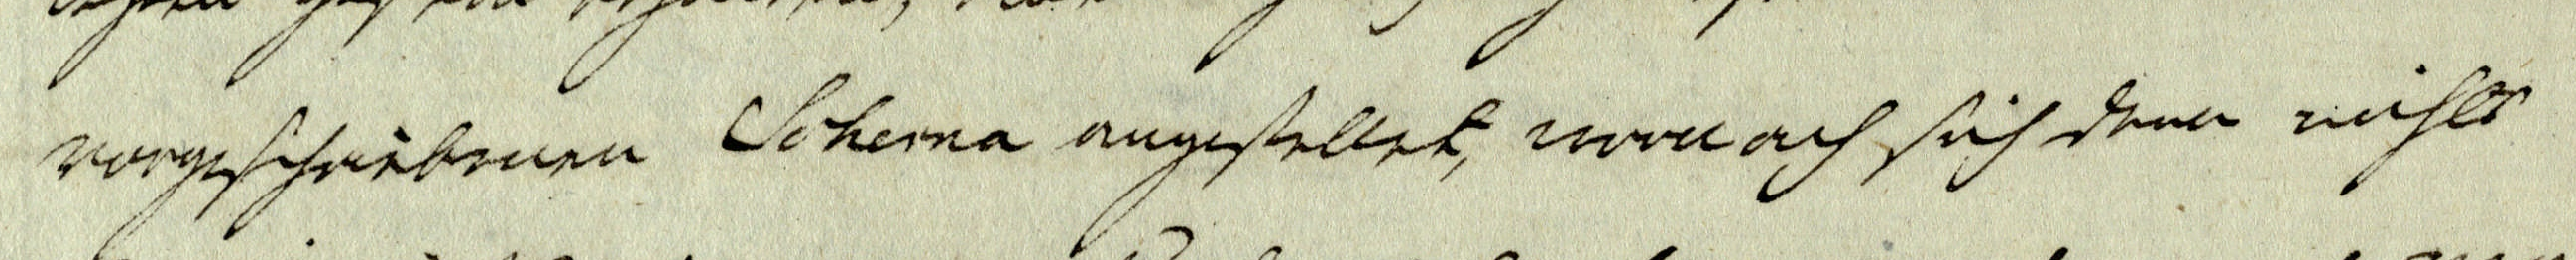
vorgeschriebenen Schema angestellet, wornach sich denn nichts
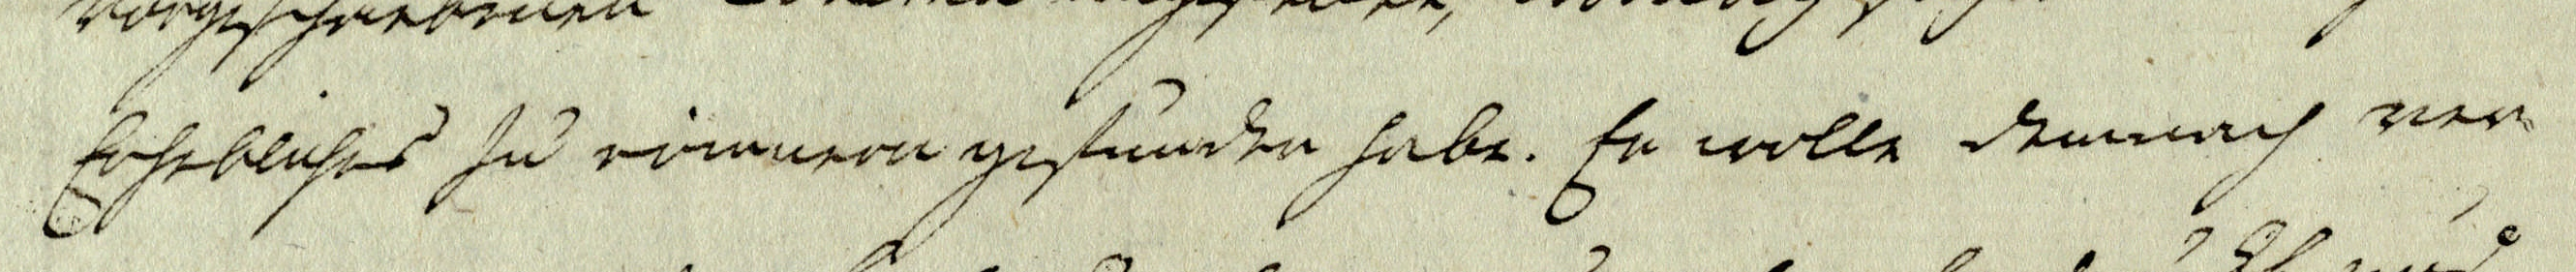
Erhebliches zu erinnern gefunden habe. Er wolle demnach ver¬
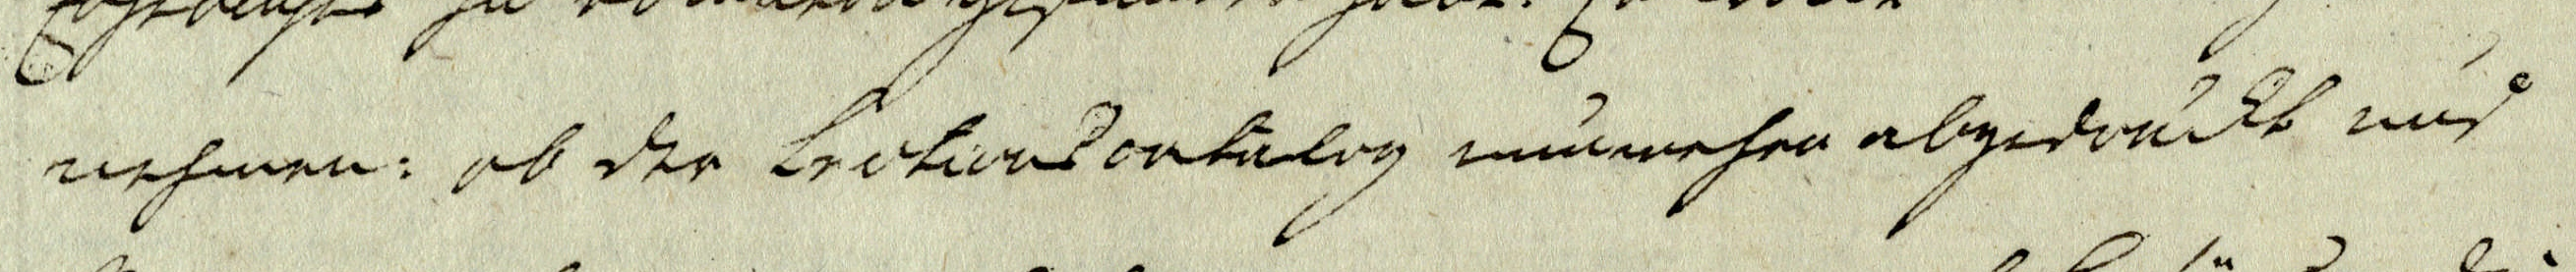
nehmen: ob der Lectionscatalog nunmehro abgedruckt und
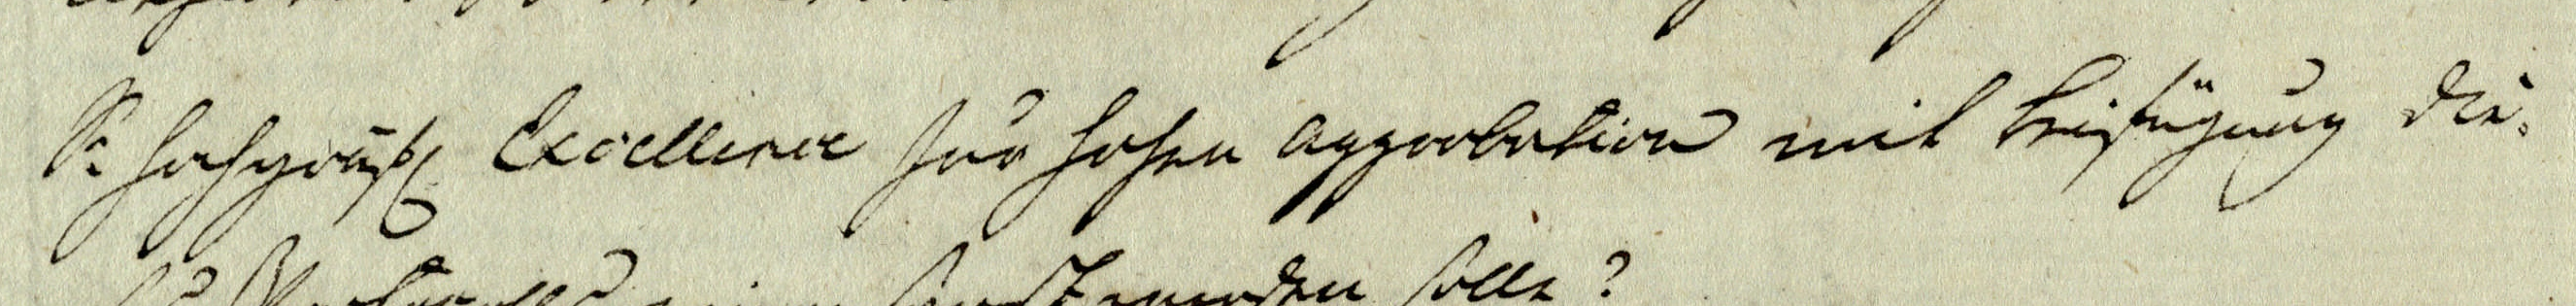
Sr Hochgräfl. Excellence zur hohen Approbation mit Beifügung die¬
